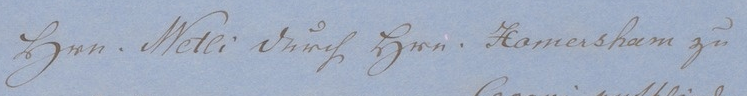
Hrn. Wetli durch Hrn. Homersham zu
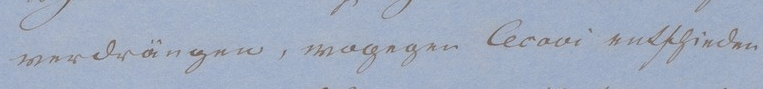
verdrängen, wogegen Cecovi entschieden
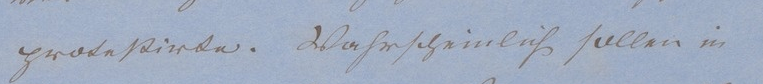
protestirte. Wahrscheinlich sollen in
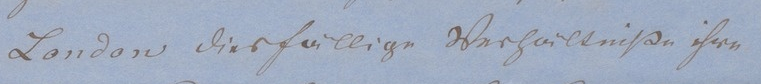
London diesfällige Verhältniße ihre
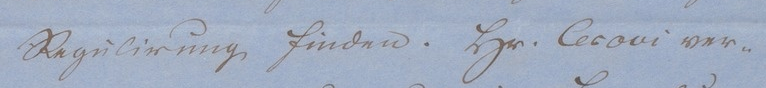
Regulirung finden. Hr. Cecovi ver-
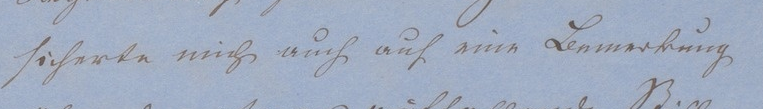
sicherte mich auch auf eine Bemerkung
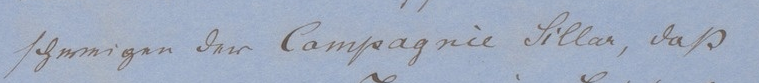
schweigen der Compagnie Sillar, daß
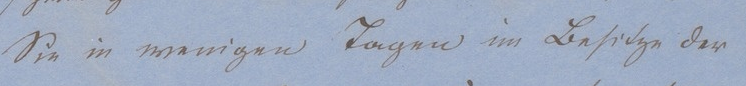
Sie in wenigen Tagen im Besitze der
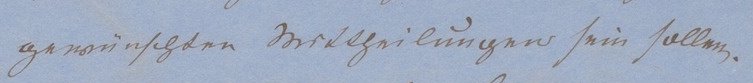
gewünschten Mittheilungen sein sollen.
